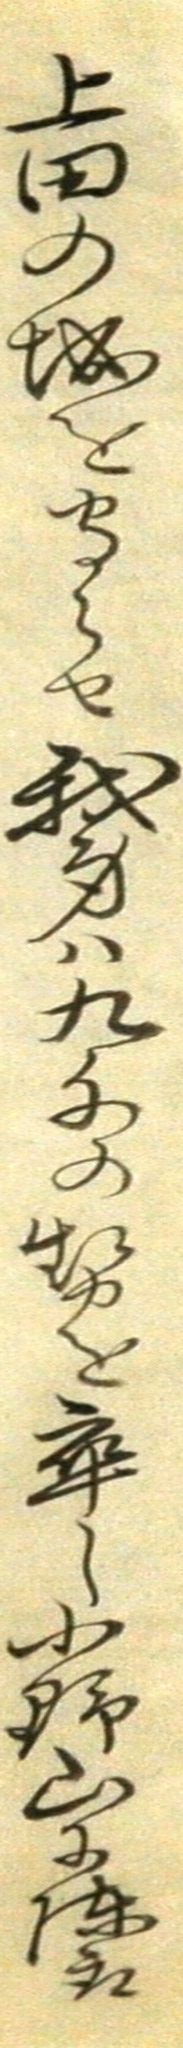上田の城を守らせ我身は九千の勢を率し小野山に陣取
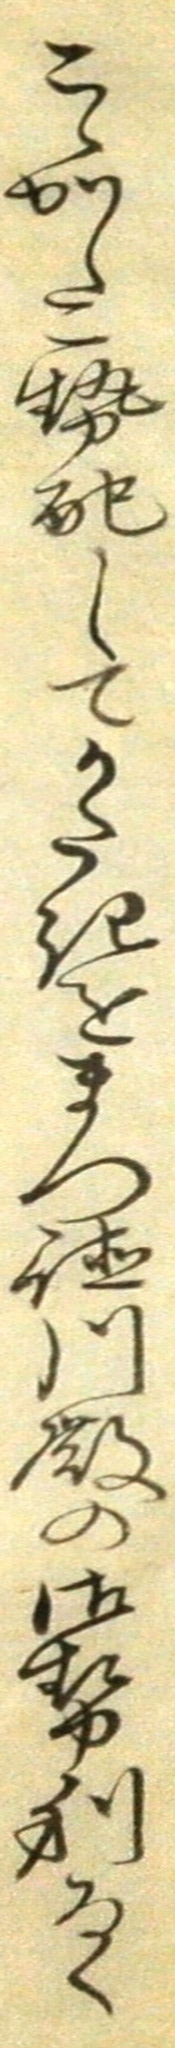こゝかしこ勢配してかたきをまつ徳川殿の御勢利なく
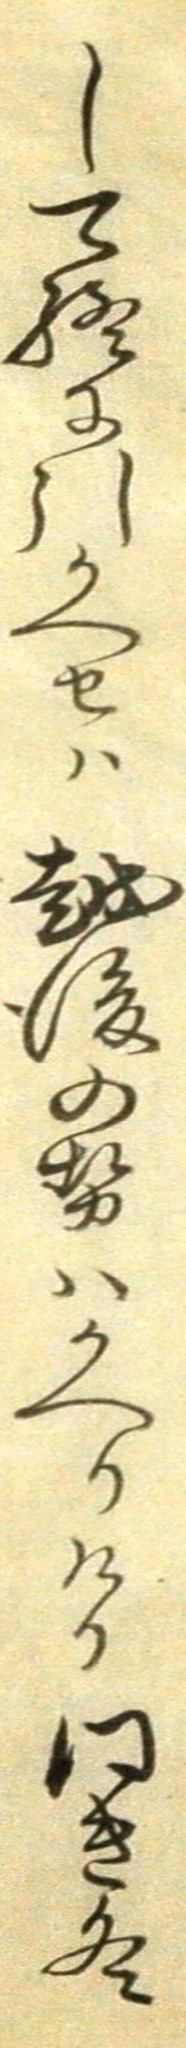して終に引かへせは越後の勢はかへりけり同き冬
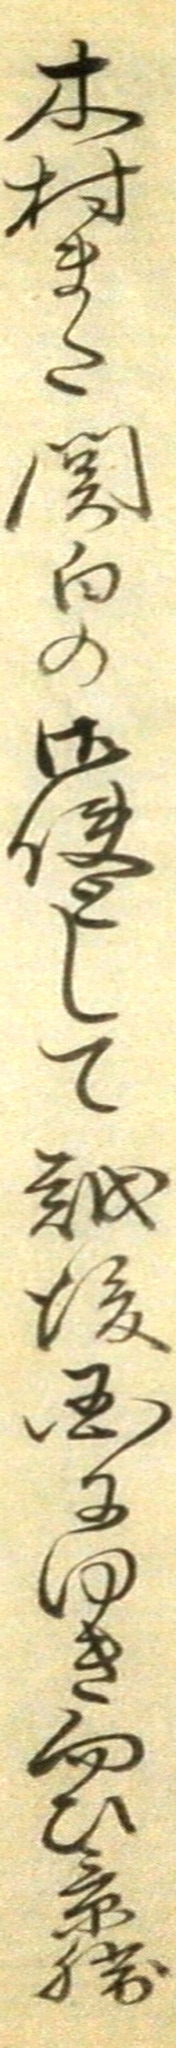木村また関白の御使として越後国にゆき向ひ景勝
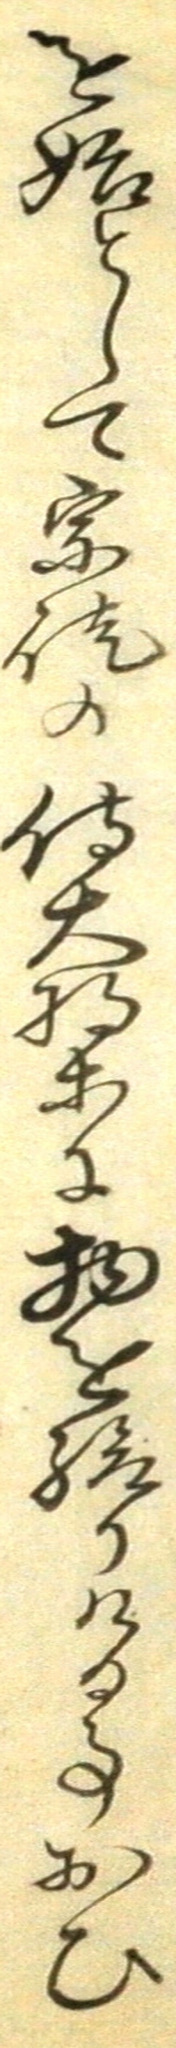を始として宗徒の侍大将等に物を給りける事おひ
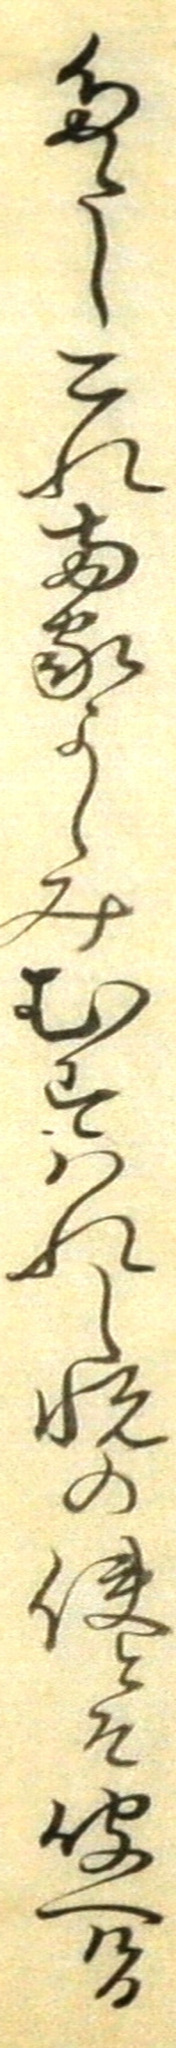たゝしこれ両家よしみむすはれし悦の使とそ聞へける
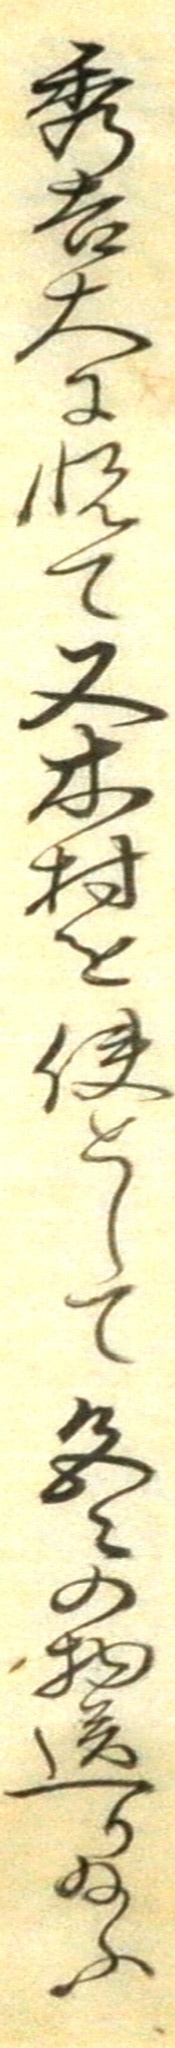秀吉大に悦て又木村を使として色々の物送り給ふ
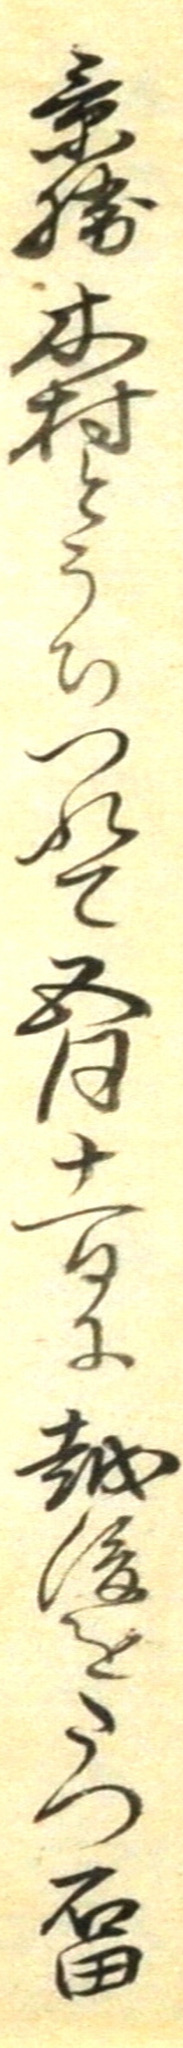景勝木村とうちつれて五月十一日に越後をたつ石田
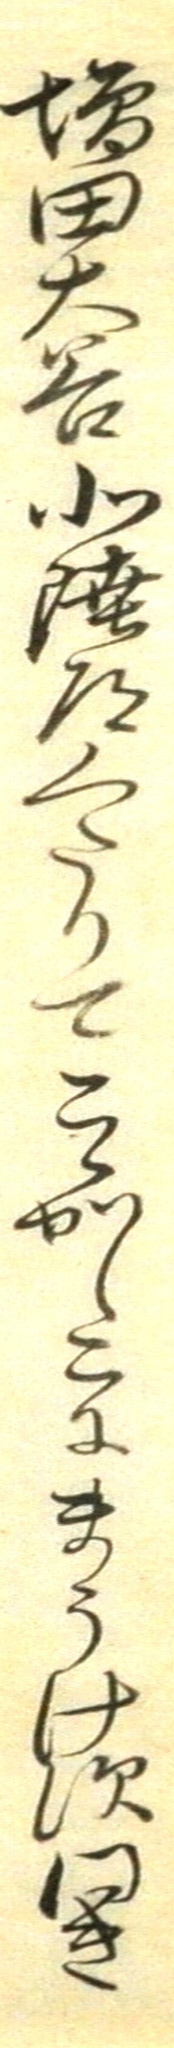増田大谷北陸道くたりてこゝかしこにまうけす同き
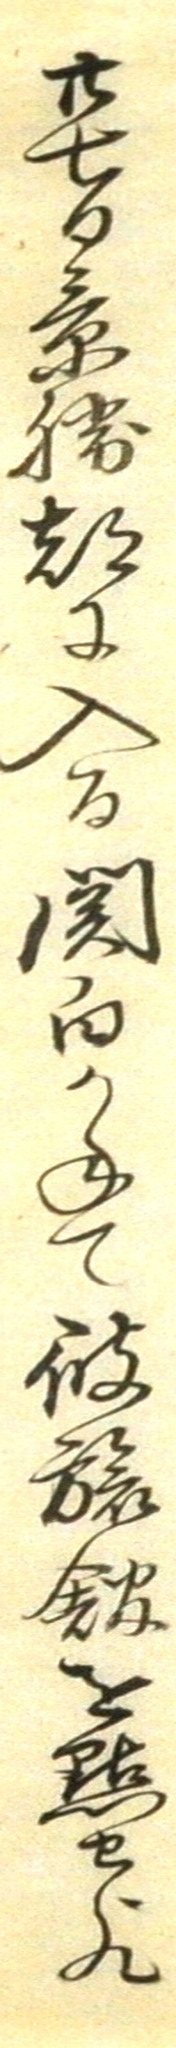廿七日景勝都に入る関白かねて彼旅館を点せられ
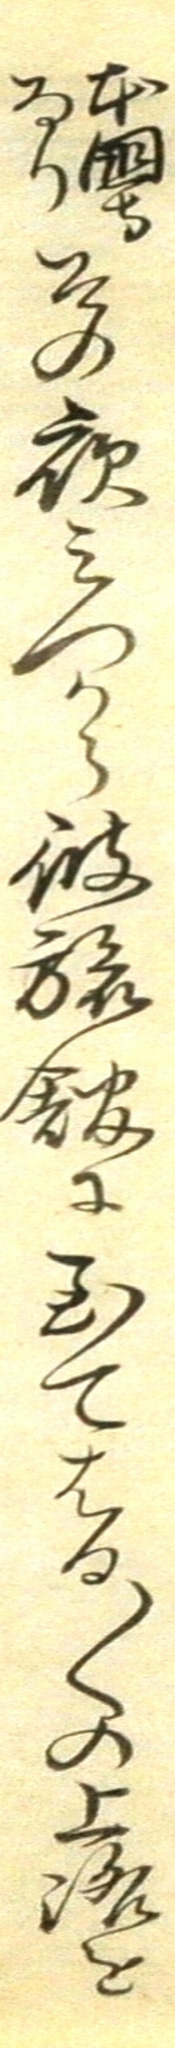本国寺なりその夜みつから彼旅館に至てはる〳〵の上洛を
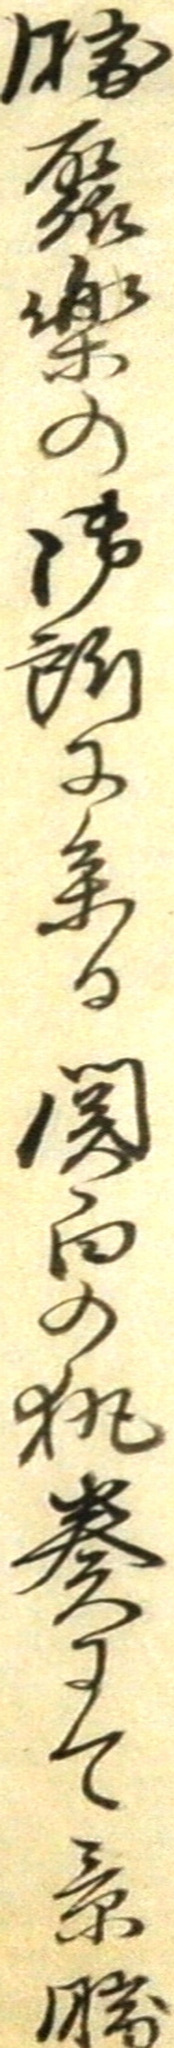勝聚楽の御所に参る関白の執奏にて景勝
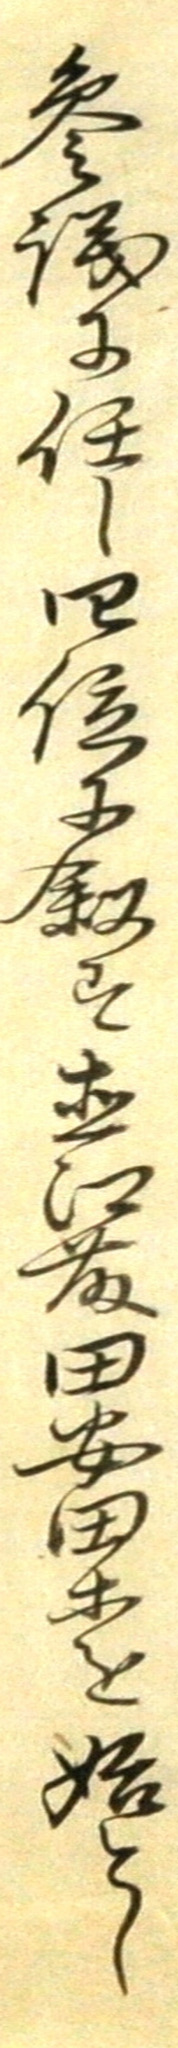参議に任し四位に叙す直江藤田安田等を始とし
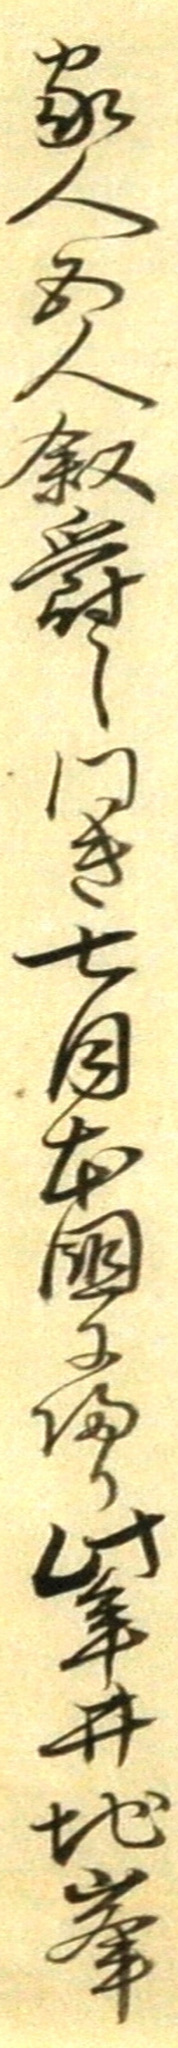家人五人叙爵し同き七月本国に帰り此年井地峯
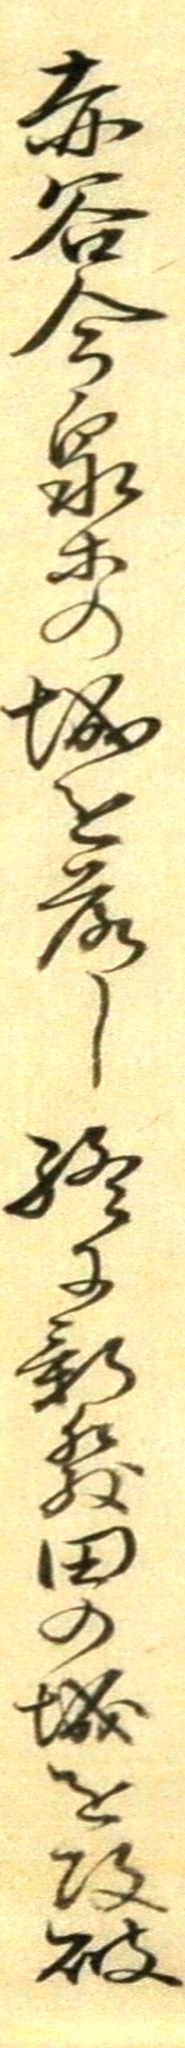赤谷今泉等の城を落し終に新発田の城を攻破
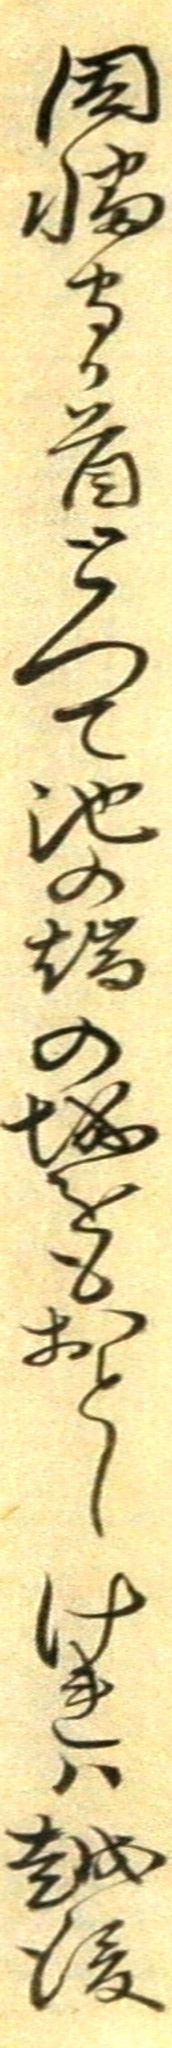因幡守か首とつて池の端の城をもおとしけれは越後
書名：藩翰譜（八・下）
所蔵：伊那市立高遠町図書館・合同会社AMANE
